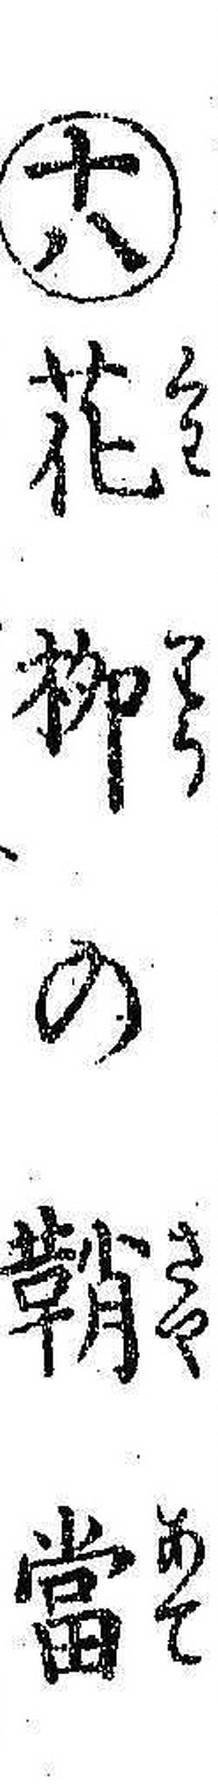十八花柳の鞘当
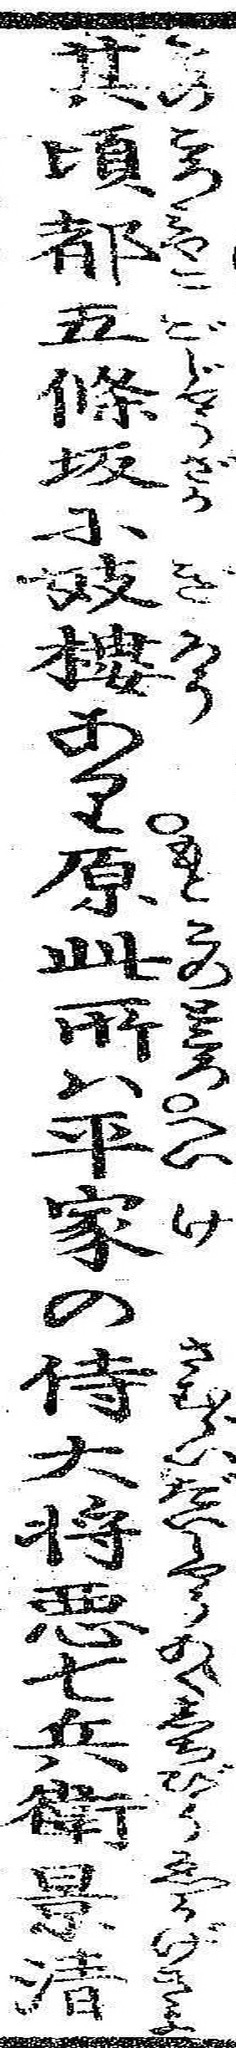其頃都五条坂に妓楼あり。原此所は。平家の侍大将悪七兵衛景清
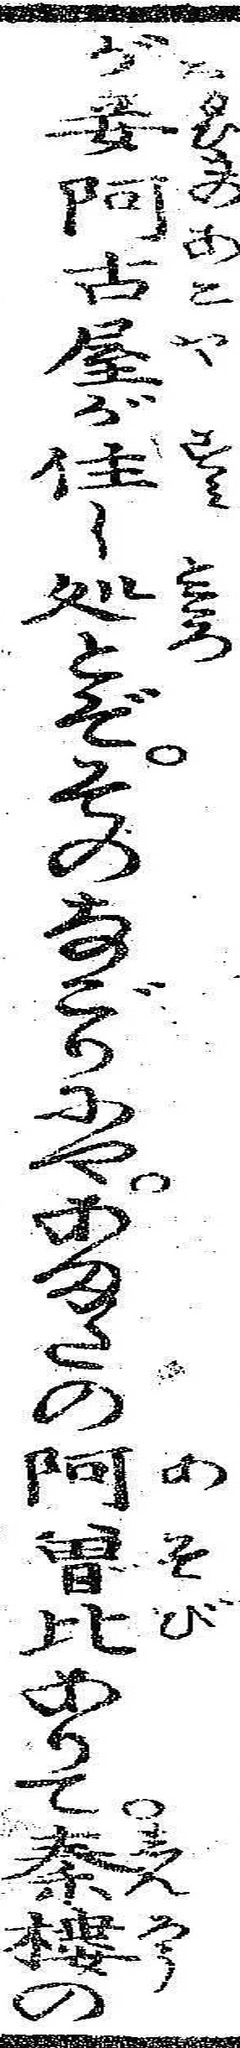が妾阿古屋が住し処とぞ。そのなごりにや。あまたの阿曽比ありて。秦楼の
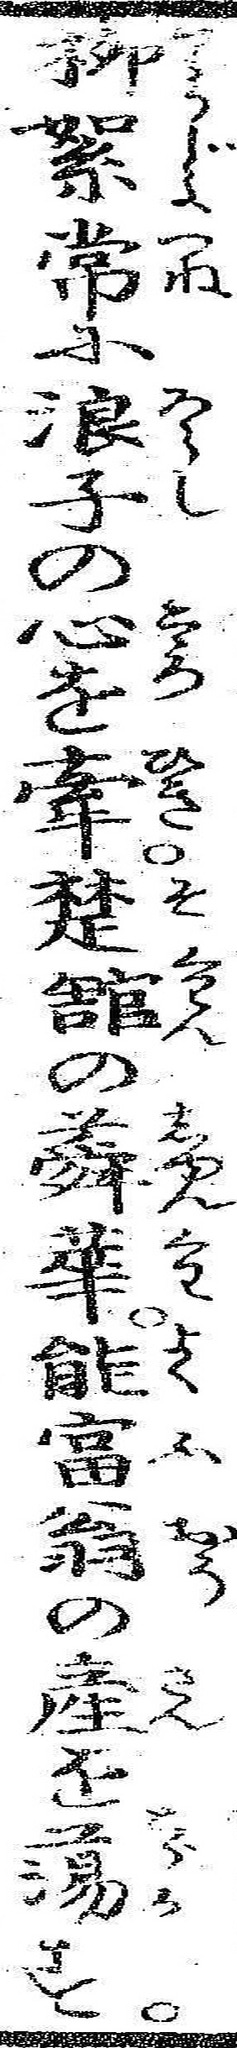柳絮常に浪子の心を牽。楚館の蕣華。能富翁の産を蕩す。
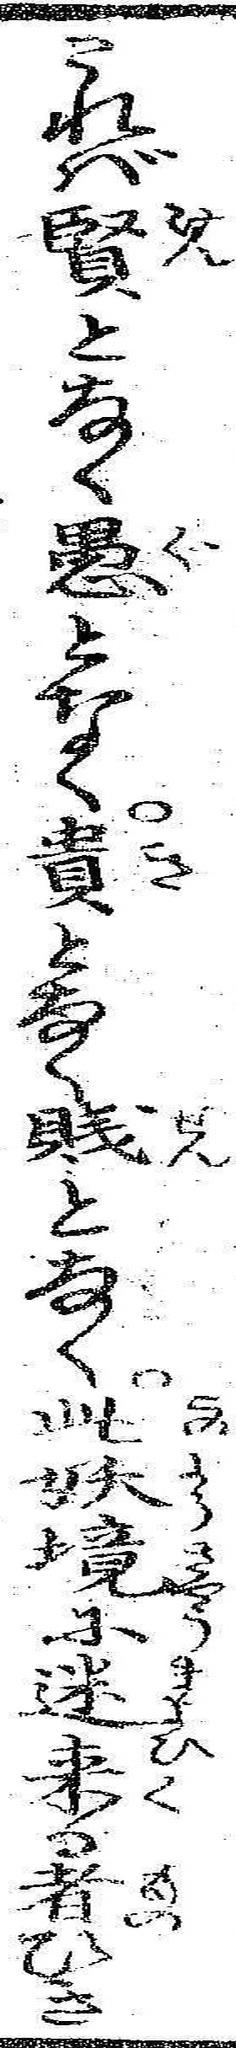されば賢となく愚となく。貴となく賎となく。此妖境に迷来る者ひき
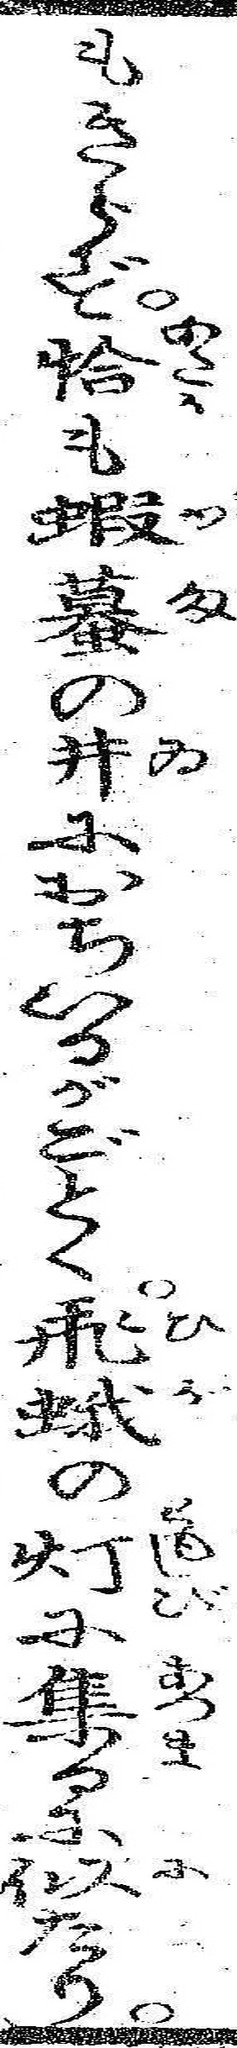もきらず。恰も蝦蟇の井におちいるがごとく。飛蛾の灯に集るに似たり。
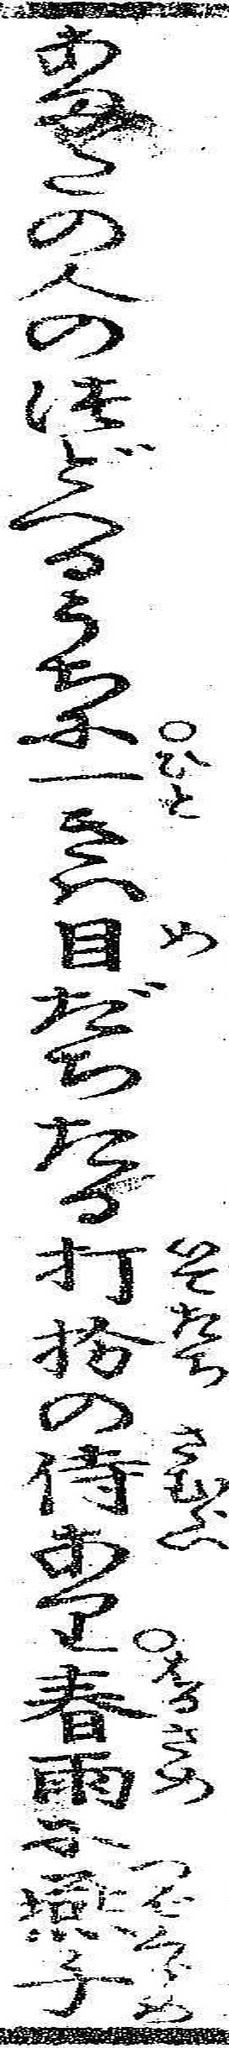あまたの人のつどへるうちに。一きは目だちたる打扮の侍あり。春雨に燕子
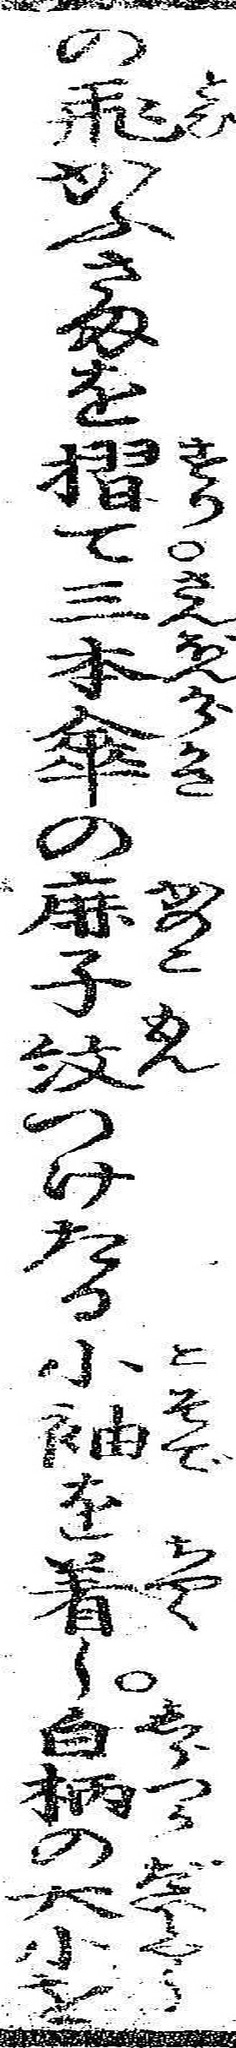の飛かふさまを摺て。三本傘の鹿子紋つけたる小袖を着し。白柄の大小を
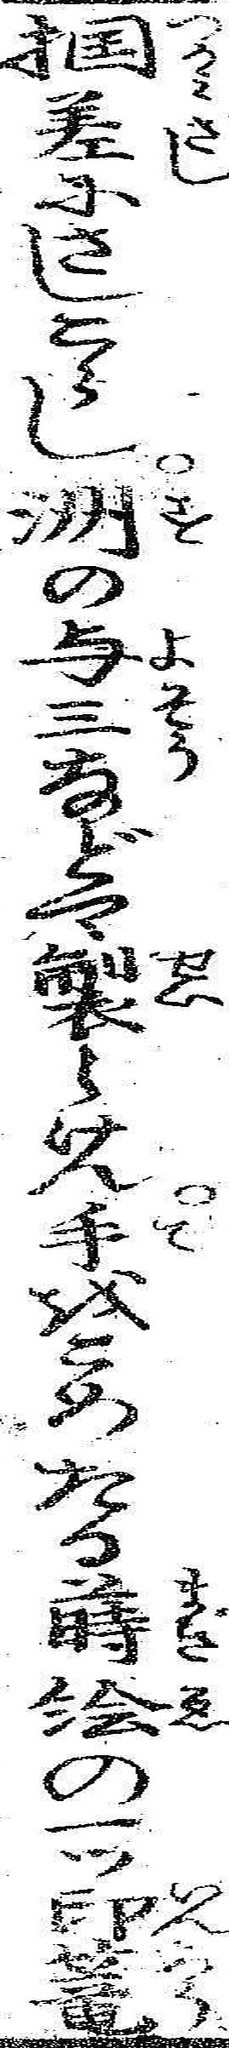掴差にさしこらし。洲の与三などや製しけん。手をこめたる蒔絵の一ツ印篭
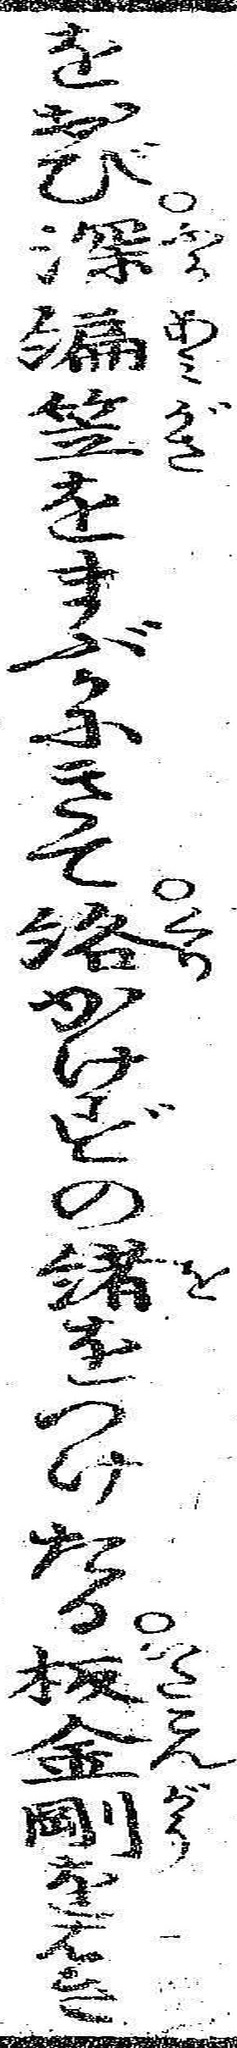をおび。深編笠をまぶかにきて。絡かけずの緒をつけたる。板金剛をはき
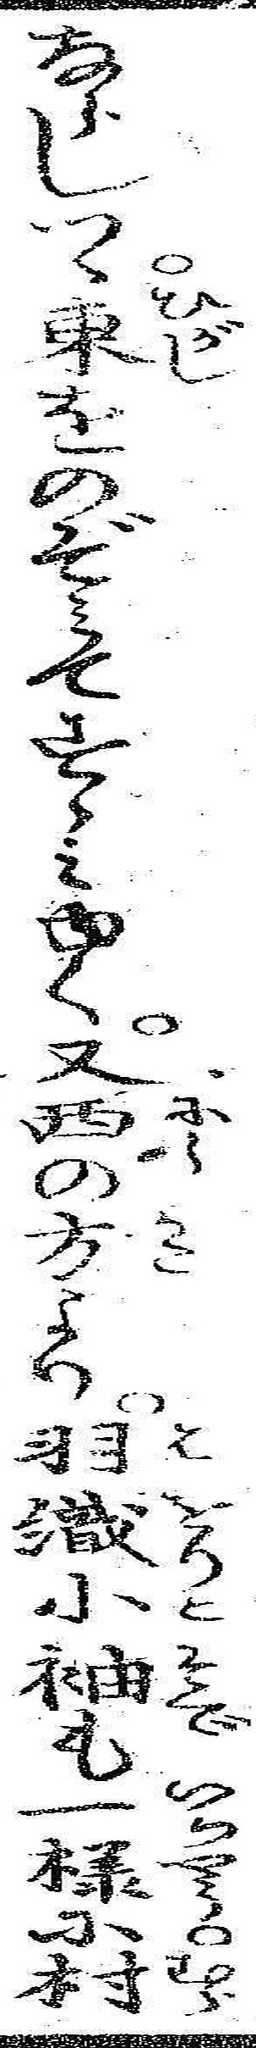ならしつゝ。東をのぞみてすゝみゆく。又西の方より。羽織小袖も一様に。村

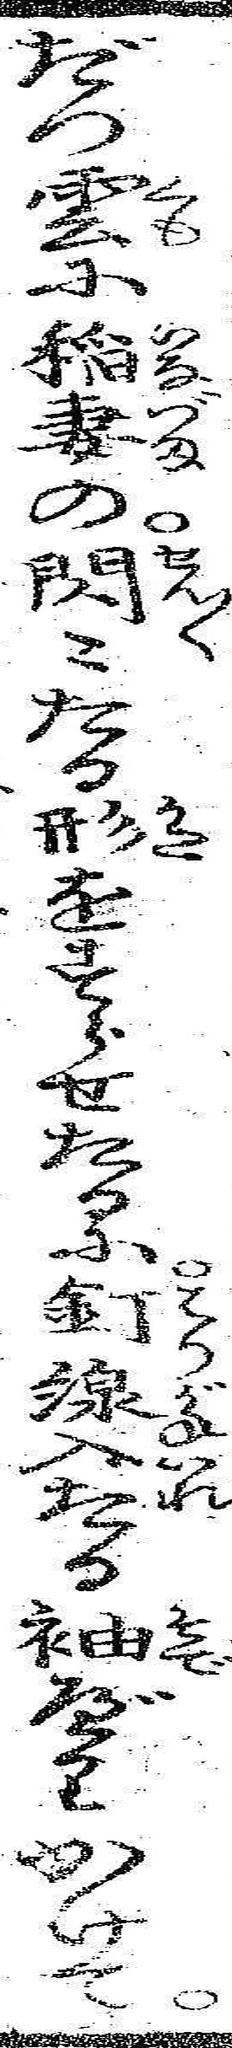だつ雲に稲妻の。閃々たる形をすらせたるに。釘線入たる袖べりかけて。
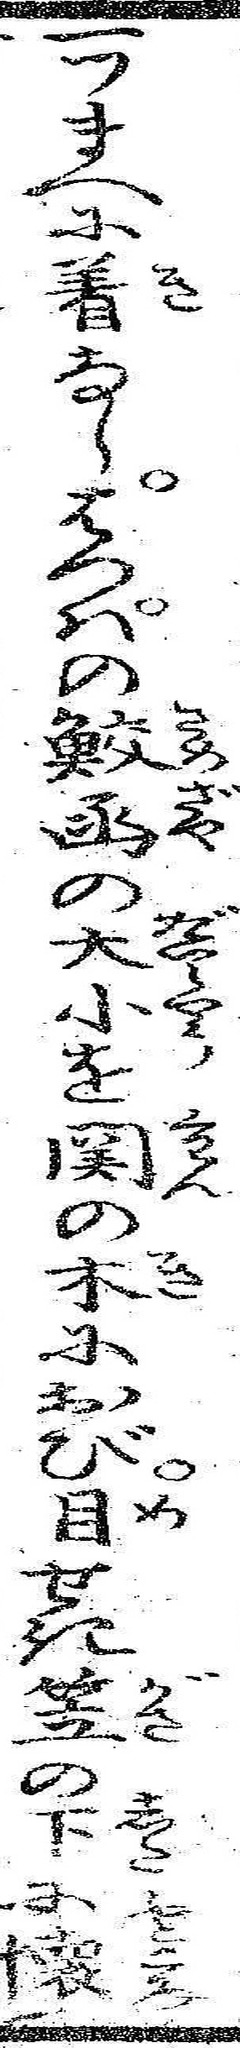一ツまへに着なし。はつぱの鮫函の大小を関の木におび。目せき笠の下に懐
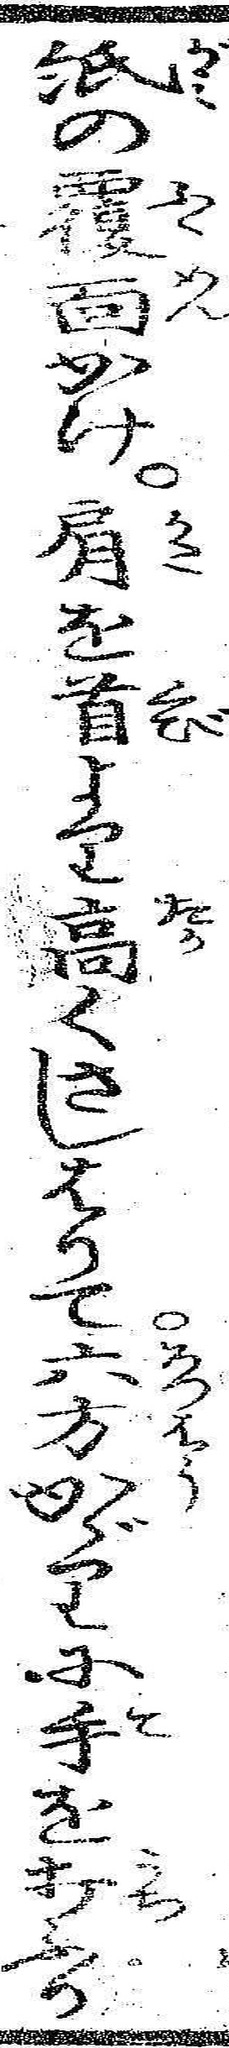紙の覆面かけ。肩を首より高くさしはりて。六方かゞりに手を打ふり
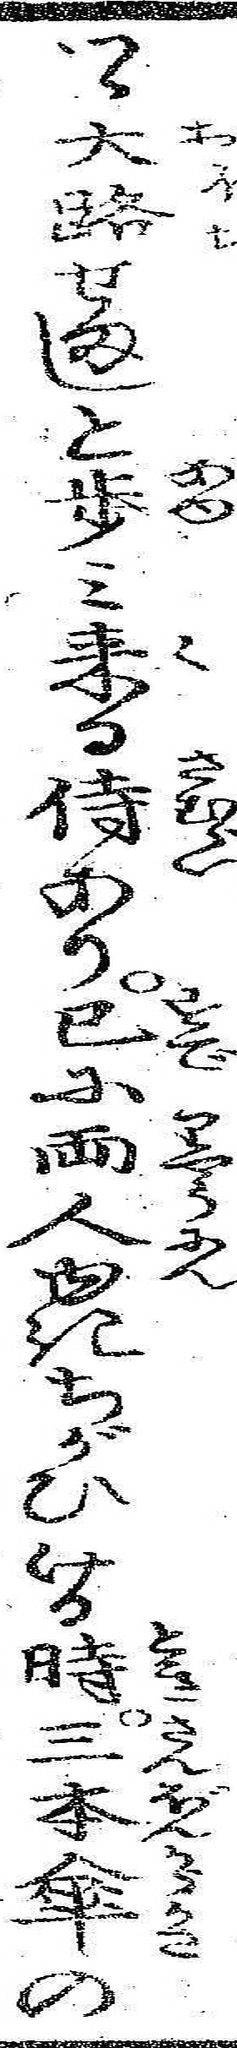つゝ大路せましと歩み来る侍あり。已に両人ゆきちがひける時。三本傘の
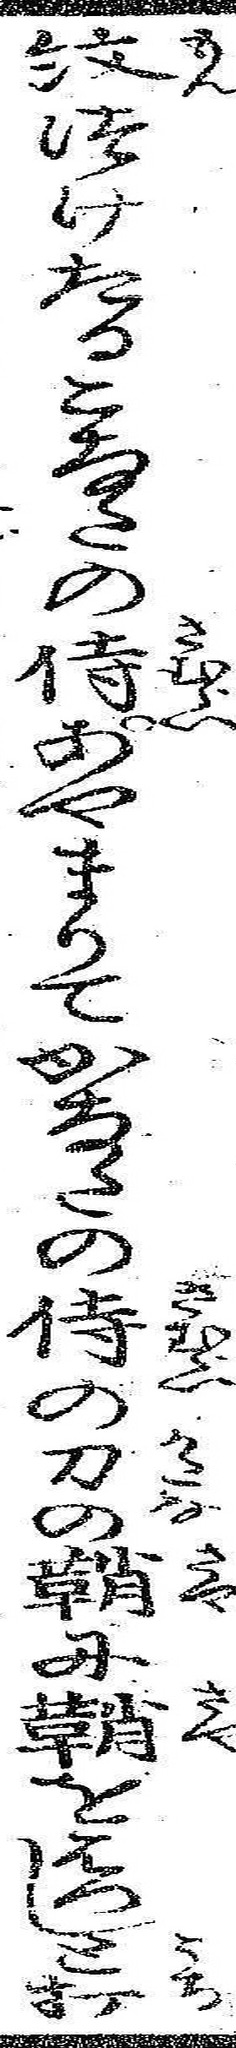紋つけたるこなたの侍。あやまりてかなたの侍の刀の鞘に鞘をはつしと打
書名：昔話稲妻表紙
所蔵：国文学研究資料館
